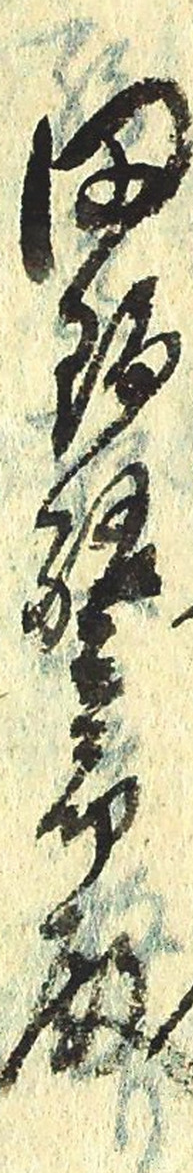田野祐太郎殿
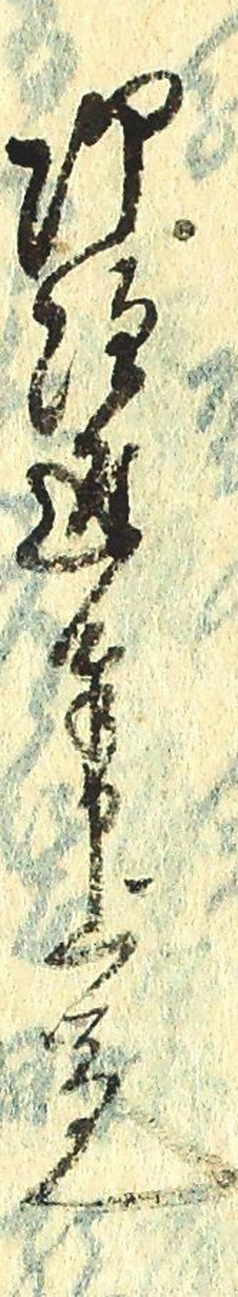御注進奉申上覚
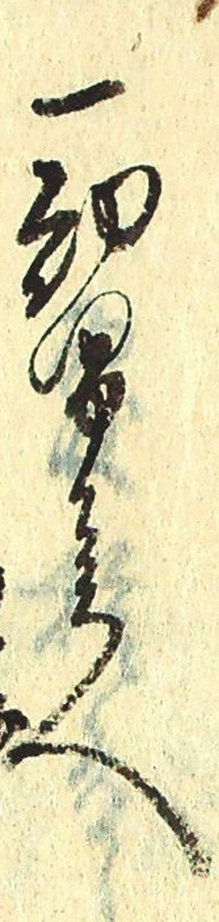一幼男壱人
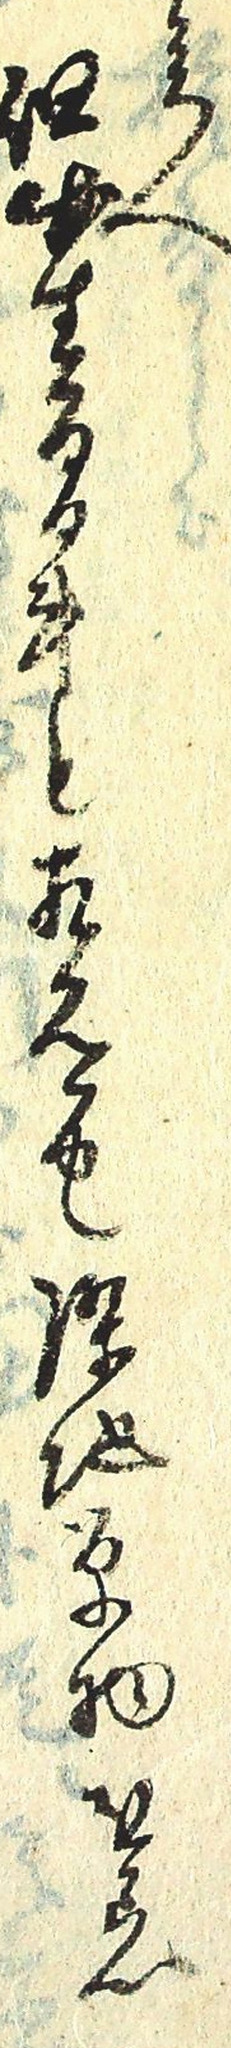但出生百日計と相見へ申候染地単物を着
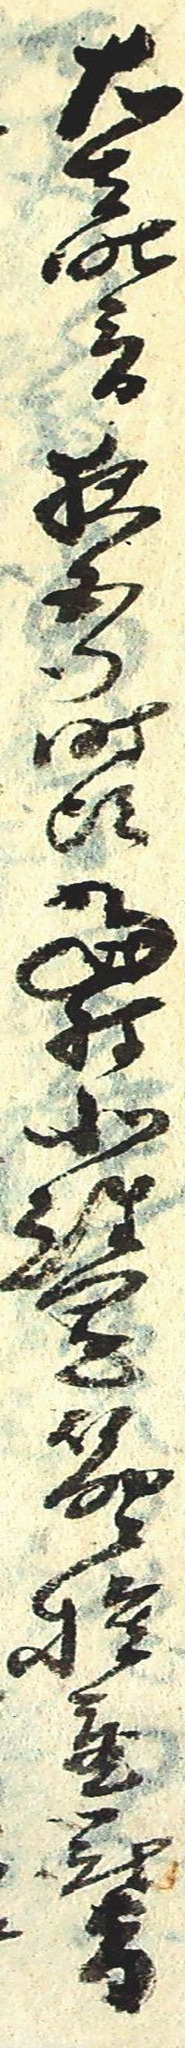右は昨三日夜五つ時頃当村北往還筋に捨置御座候旨
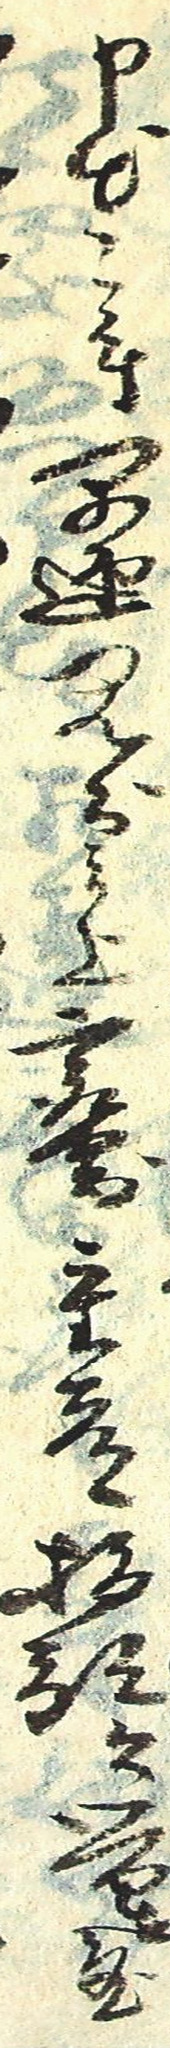申出候に付早速見分之上最寄重吉へ指預け労せ置
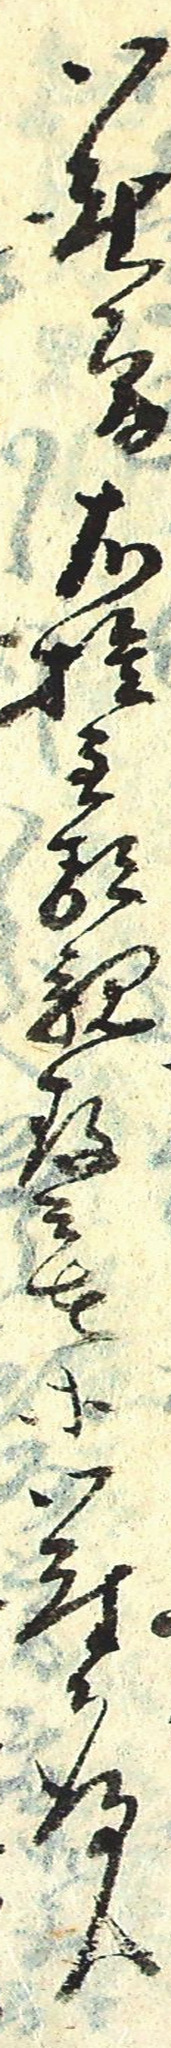御座候間右捨主類親存之者等御座候得は
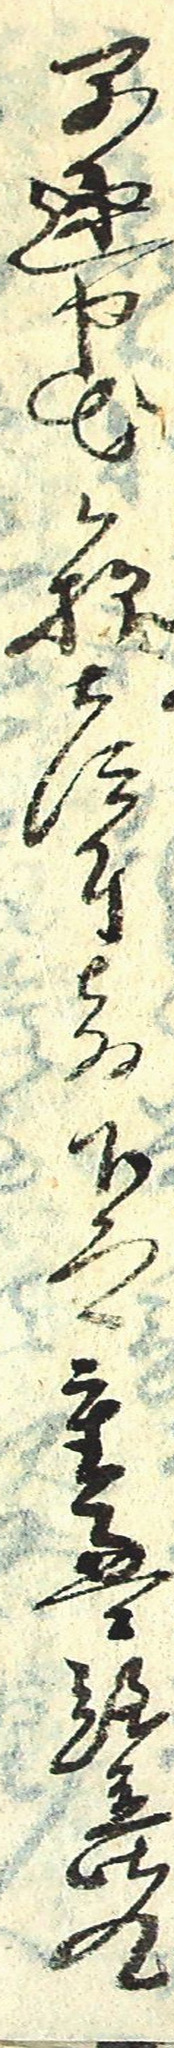早速申出候様被仰付被為下候はゝ重畳難有仕合
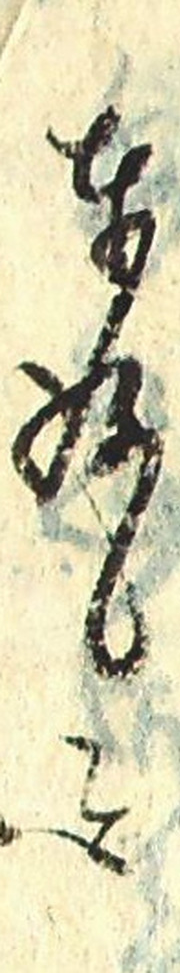奉存候以上

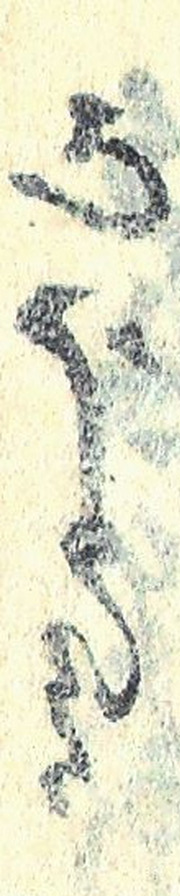安五郎
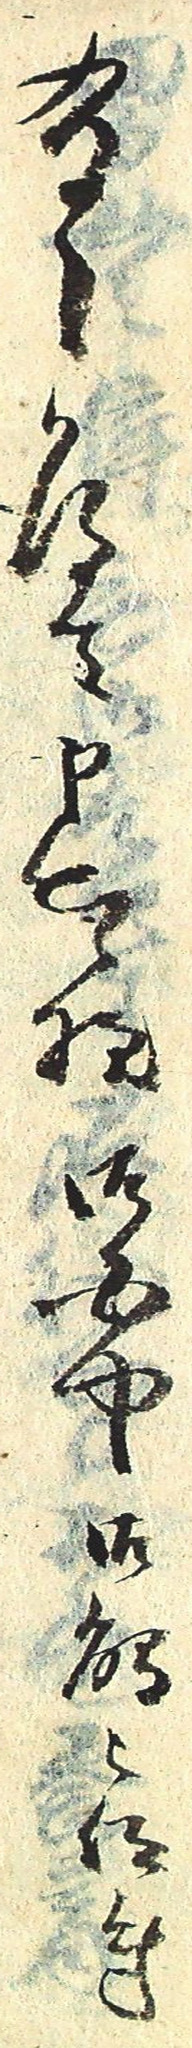有之候得は申出候様御国中御触被仰付
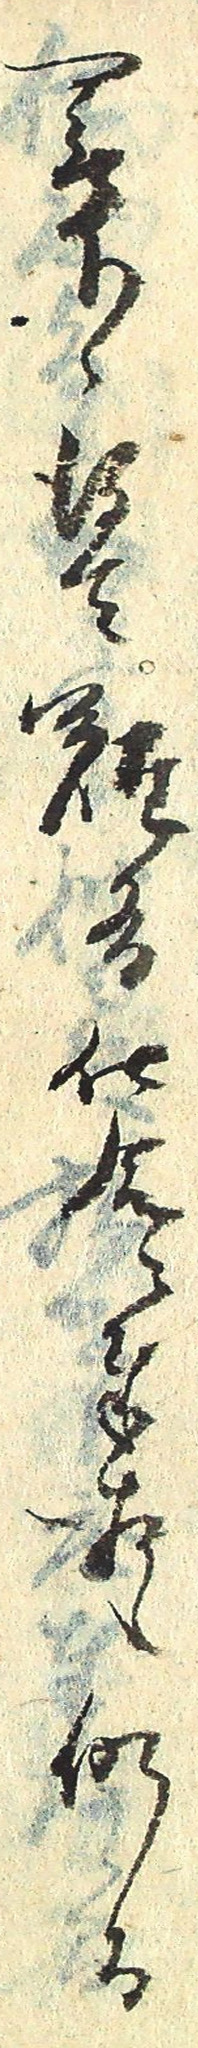可被下候得は難有仕合に奉存候仍て
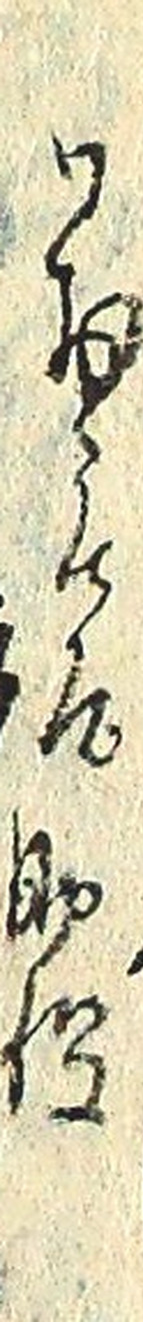同村庄屋助役
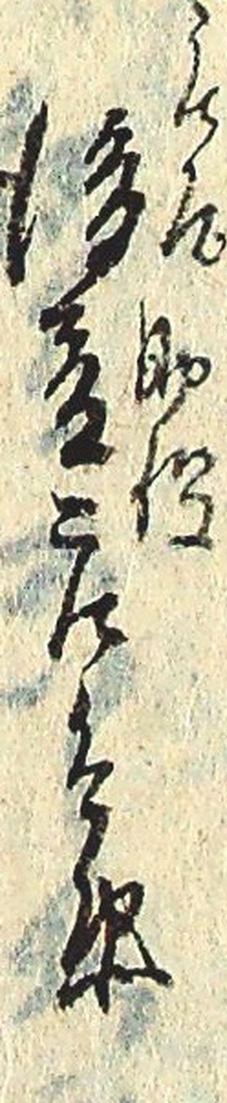後藤庄兵衛
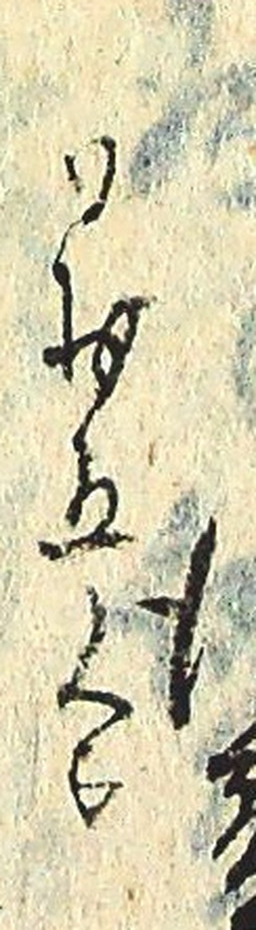同村五人与
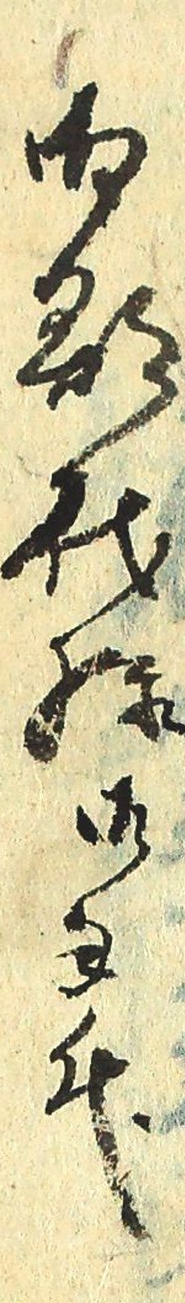御郡代様御手代
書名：諸御願書控(弐番）
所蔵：鳴門教育大学 Naruto University of Education
